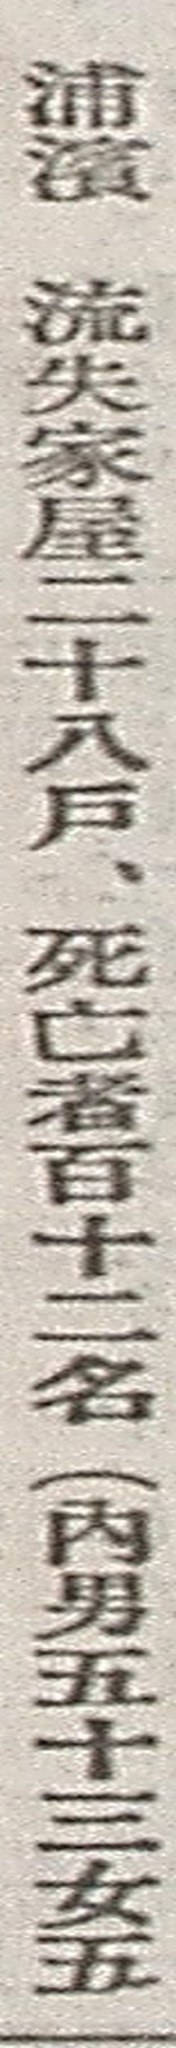浦浜流失家屋二十八戸、死亡者百十二名（内男五十三女五
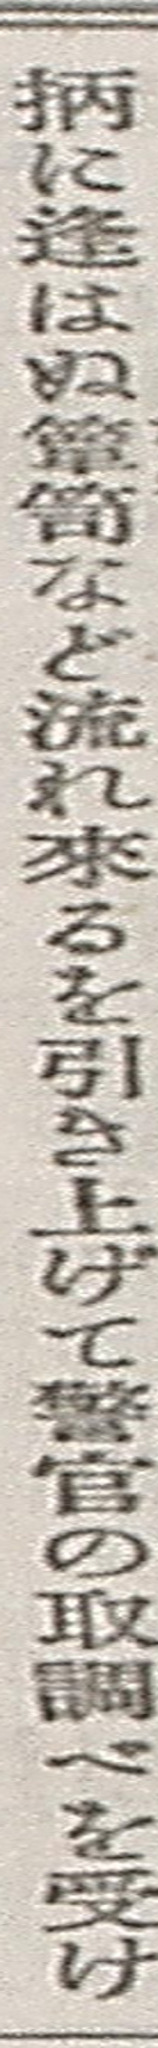抦に逢はぬ箪笥など流れ来るを引き上げて警官の取調べを受け
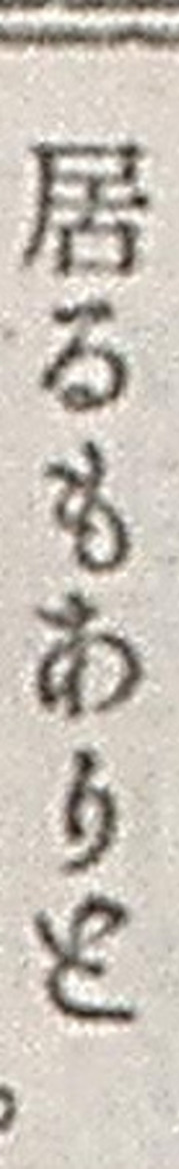居るもありと
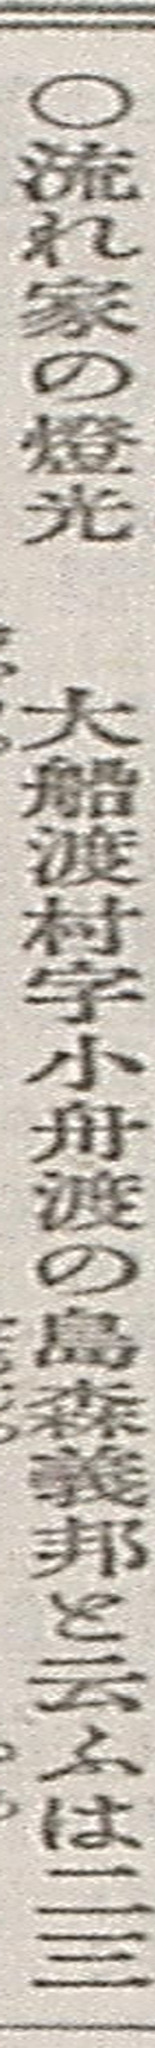○流れ家の灯光大船渡村字小舟渡の島森義邦と云ふは二三
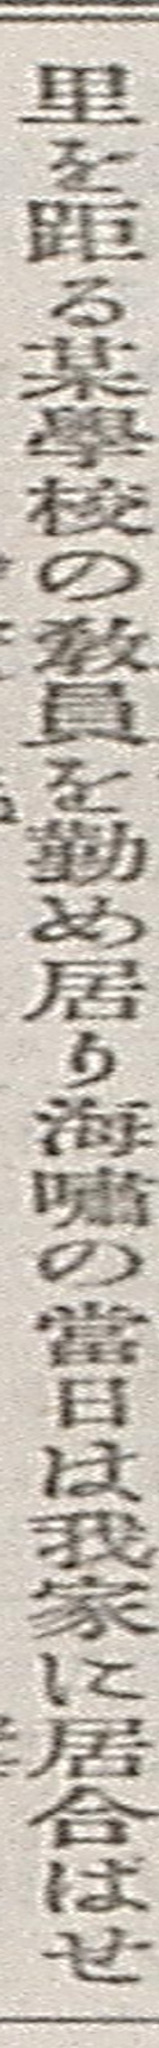里を距る某学校の教員を勤め居り海嘯の当日は我家に居合はせ
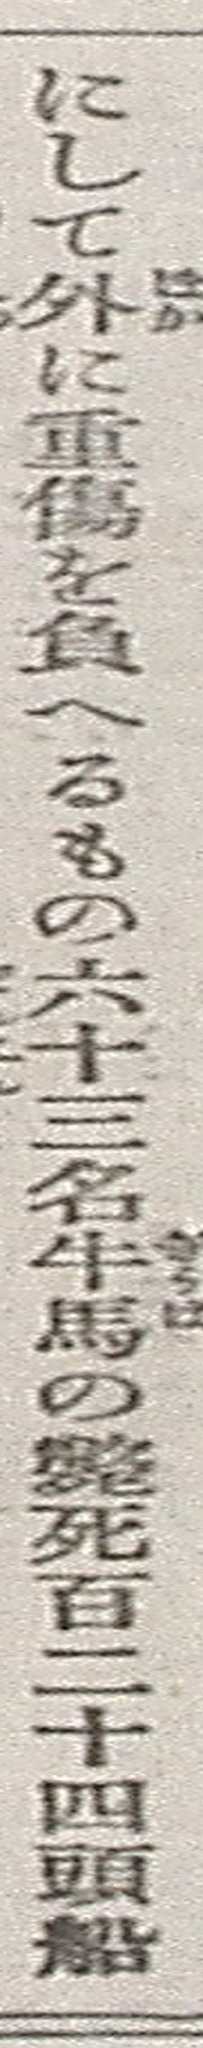にして外に重傷を負へるもの六十三名牛馬の斃死百二十四頭船
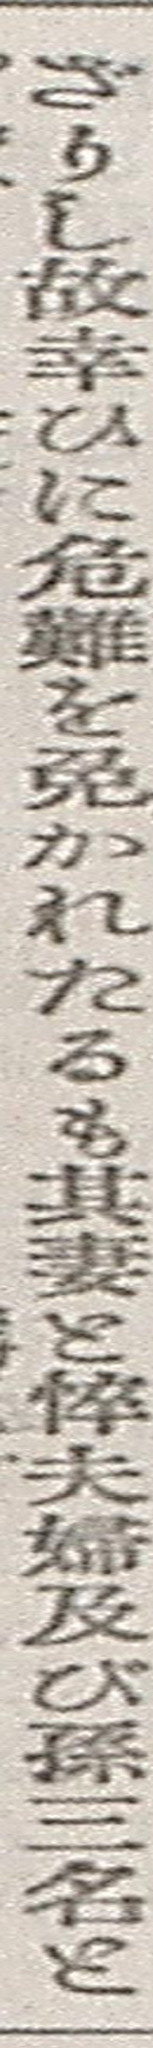ざりし故幸ひに危難を免かれたるも其妻と悴夫婦及び孫三名と
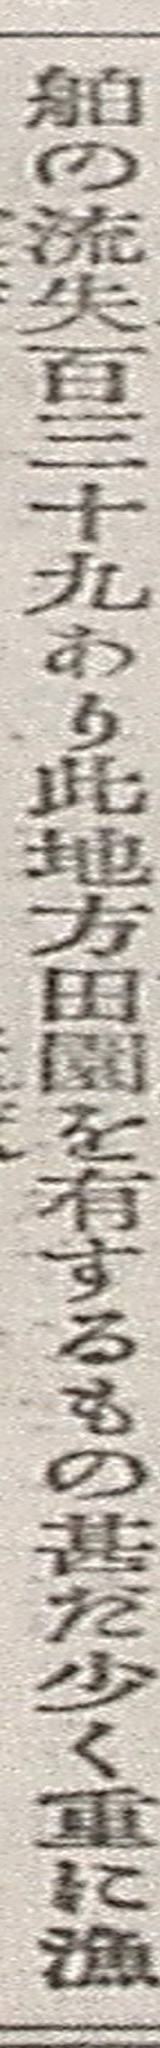舶の流失百三十九あり此地方田園を有するもの甚だ少なく重に漁
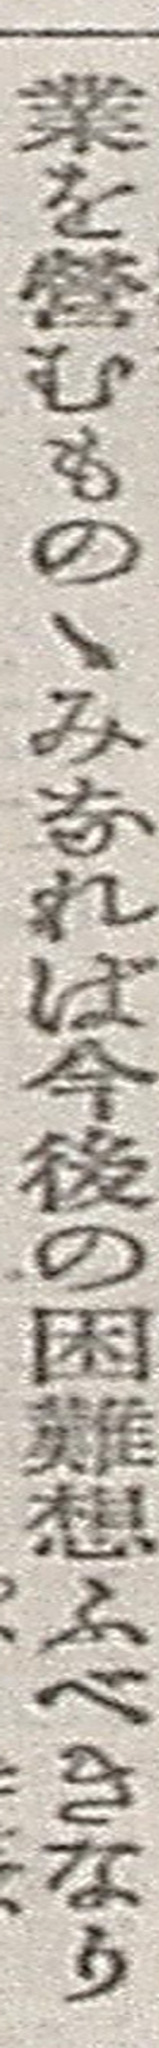業を營むものゝみなれば今後の困難想ふべきなり
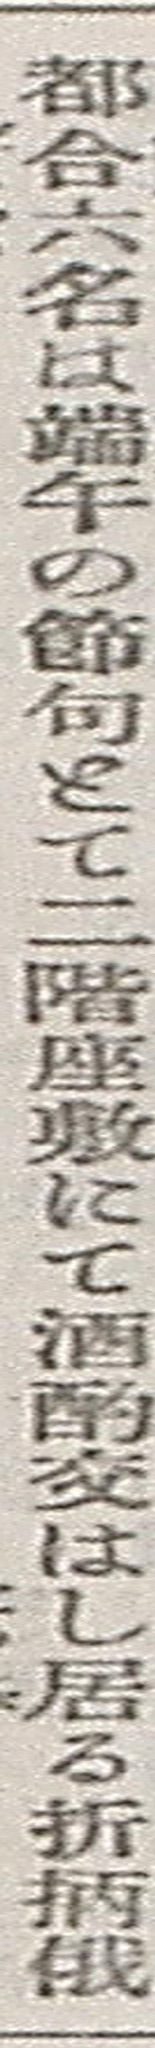都合六名は端午の節句とて二階座敷にて酒酌交はし居る折柄俄
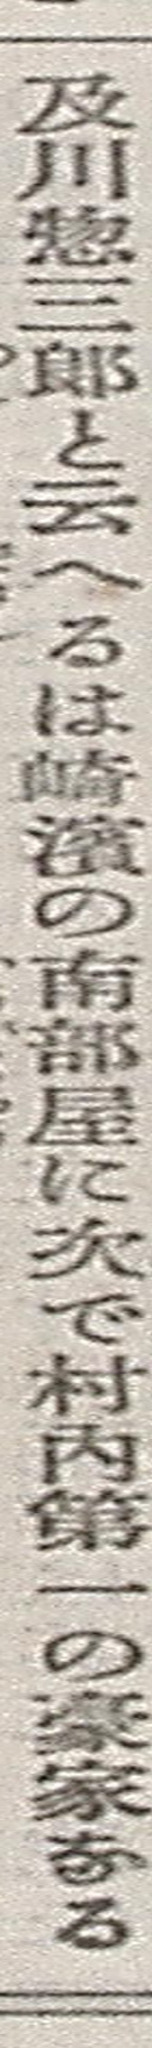及川惣三郎と云へるは崎浜の南部屋に次で村内第一の豪家なる
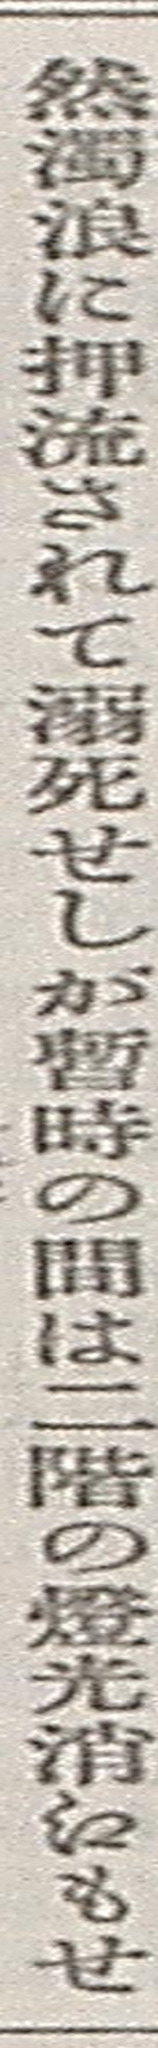然濁浪に押流されて溺死せしが暫時の間は二階の灯火消えもせ
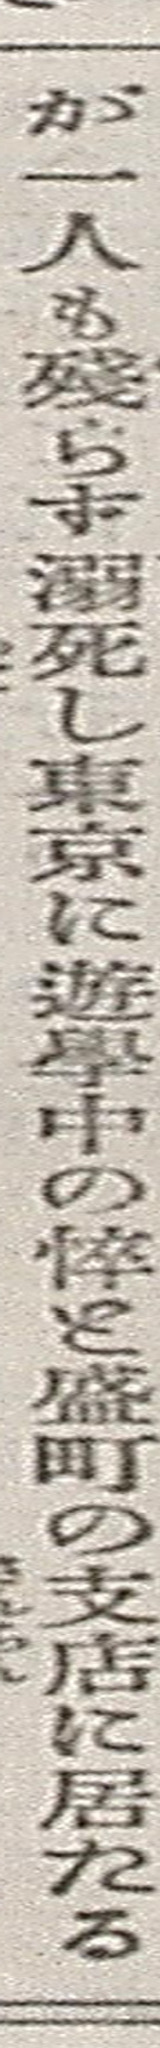が一人も残らず溺死し東京に遊学中の悴と盛町の支店に居たる
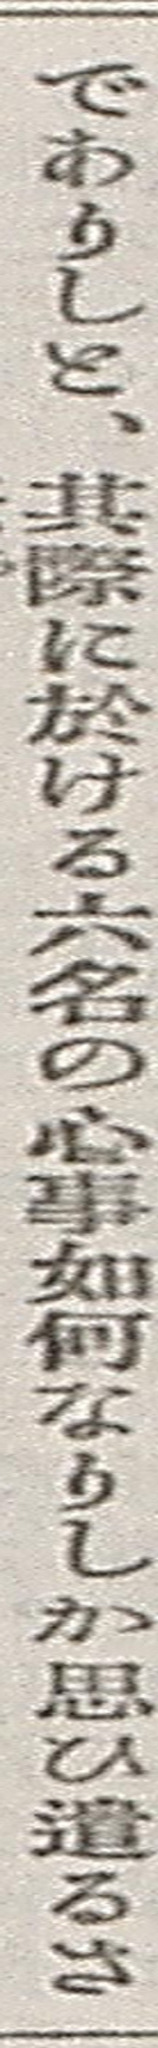でありしと、其際に於ける六名の心事如何なりしか思ひ遣るさ
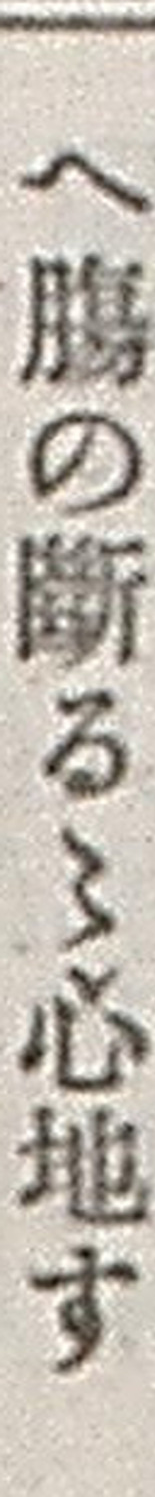へ腸の断る〻心地す
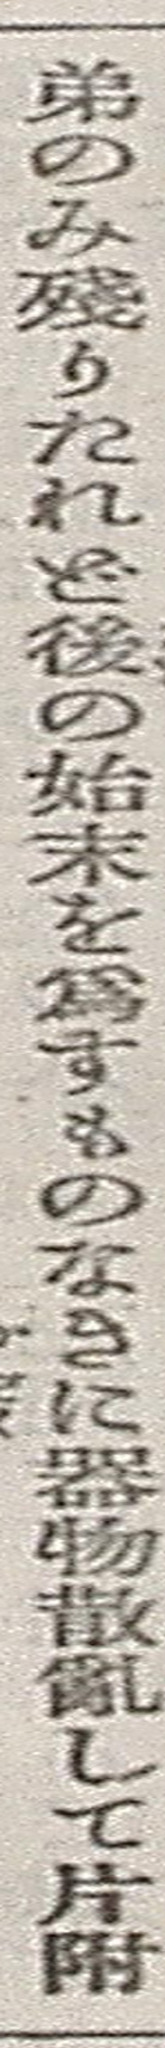弟のみ残りたれど後の始末を為すものなきに器物散乱して片付
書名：風俗畫報臨時増刊第百十九號　大海嘯被害録（中）
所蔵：東京大学地震研究所図書室 Earthquake Research Institute Library, The University of Tokyo, JAPAN
